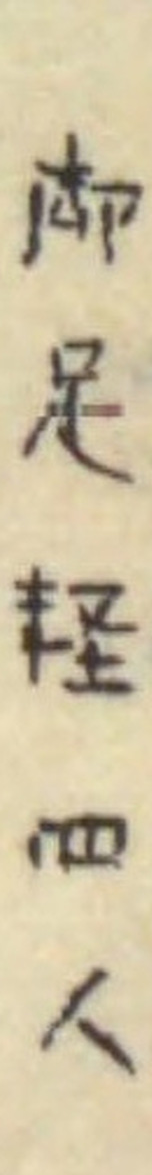御足軽四人
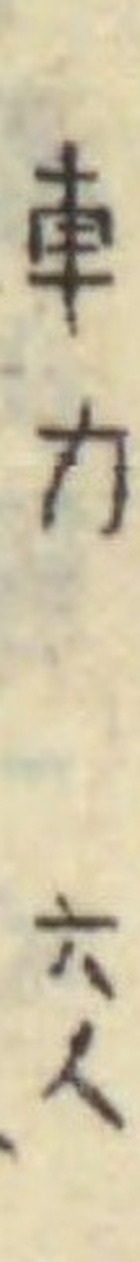車力六人
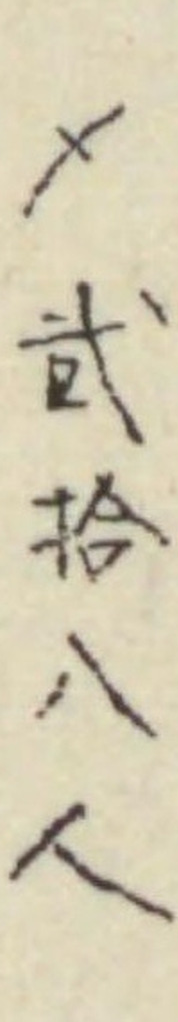〆弐拾八人
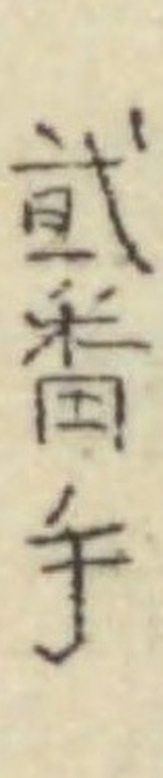弐番手
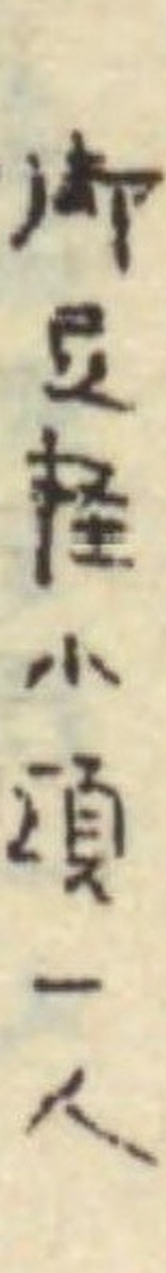御足軽小頭一人
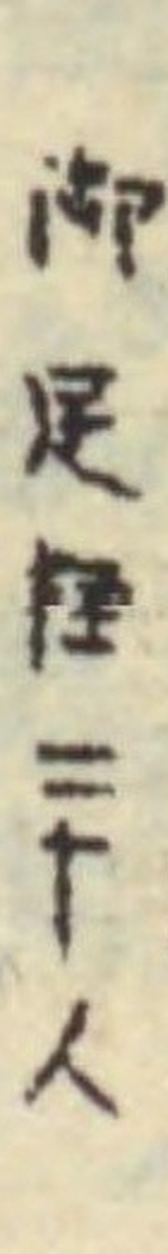御足軽二十人
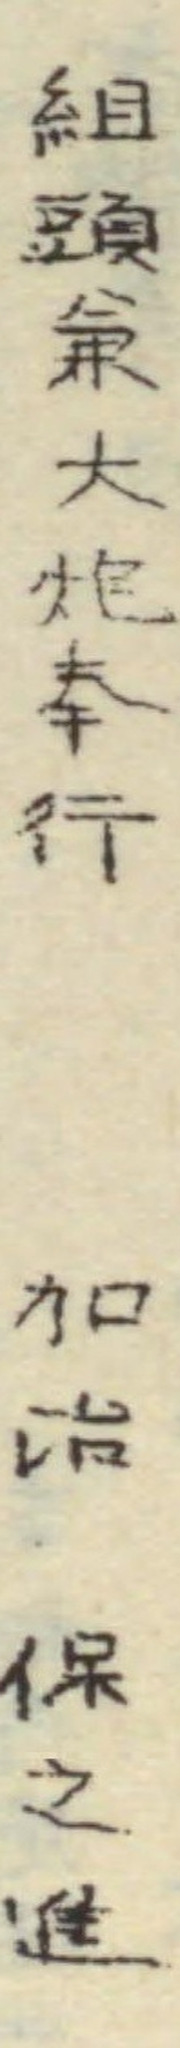騎馬組頭兼大炮奉行加治保之進
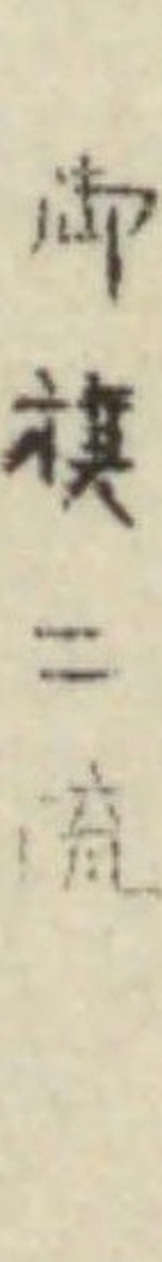御旗二流
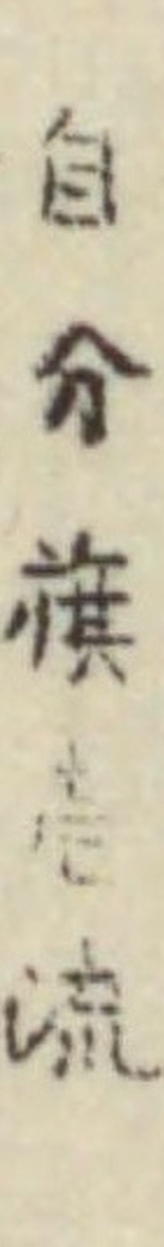自分旗壱流
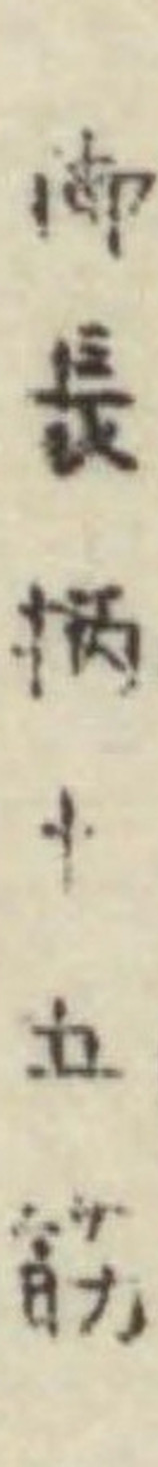御長柄十五筋
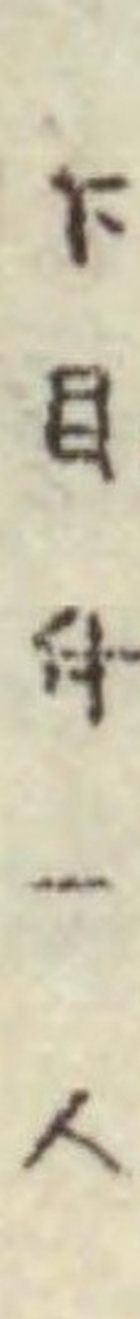給人下目付一人
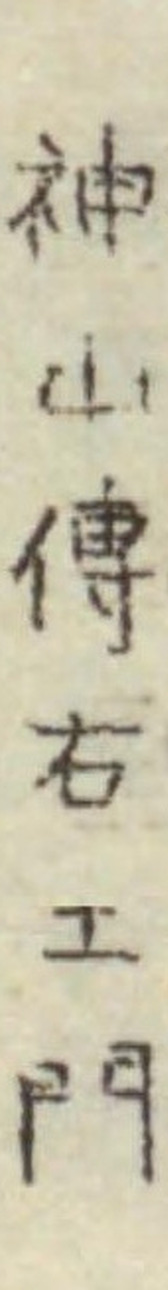神山伝右エ門
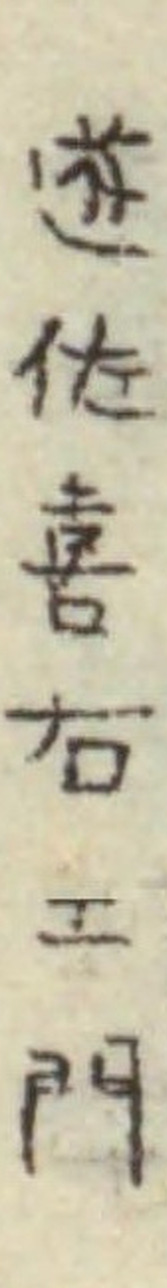遊佐喜右エ門
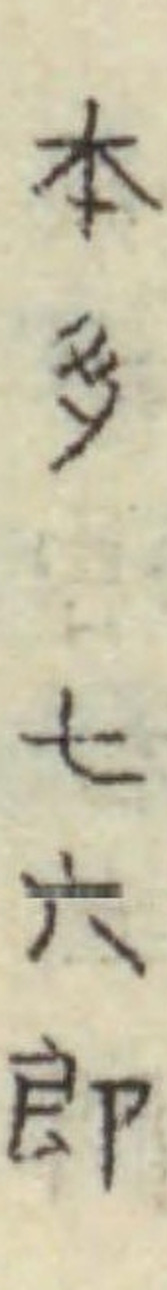本多七六郎
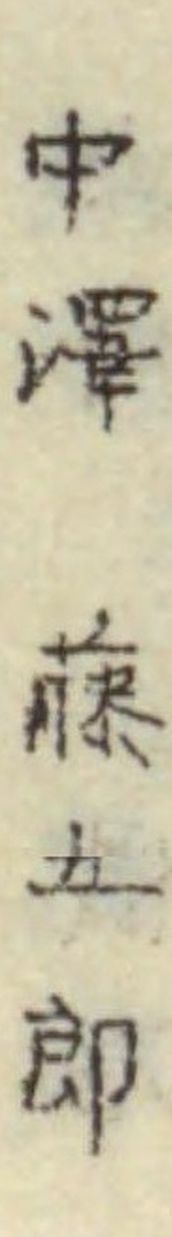中沢籐五郎
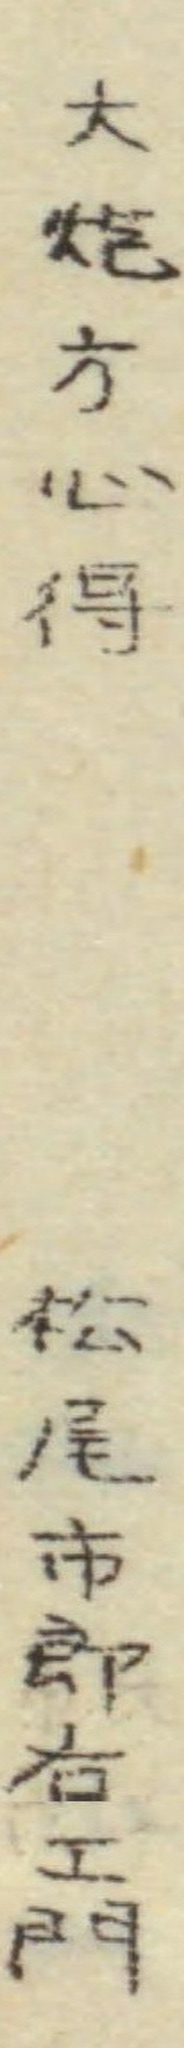大炮方心得松尾市郎右エ門
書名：三河吉田藩動員史料
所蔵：国立国会図書館 National Diet Library, JAPAN
